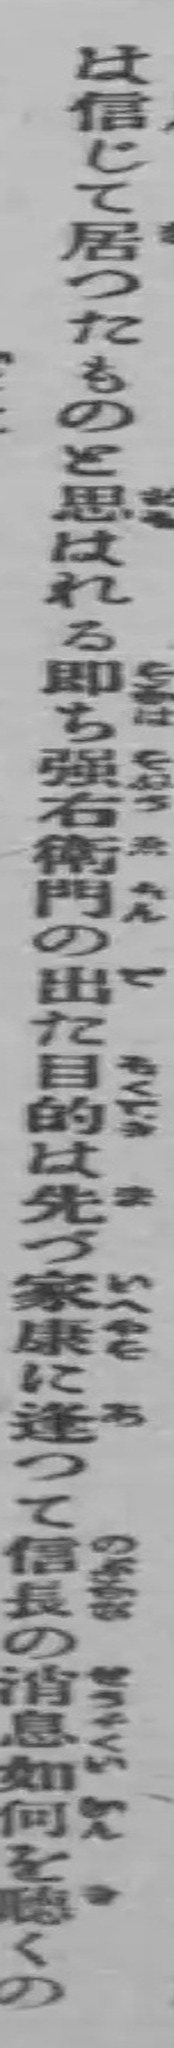は信じて居つたものと思はれる即ち強右衛門の出た目的は先づ家康に逢つて信長の消息如何を聴くの
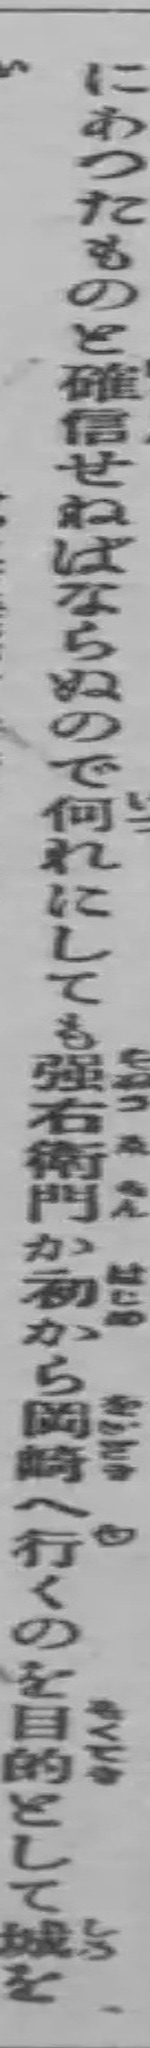にあつたものと確信せねばならぬので何れにしても強右衛門か初から岡崎へ行くのを目的として城を
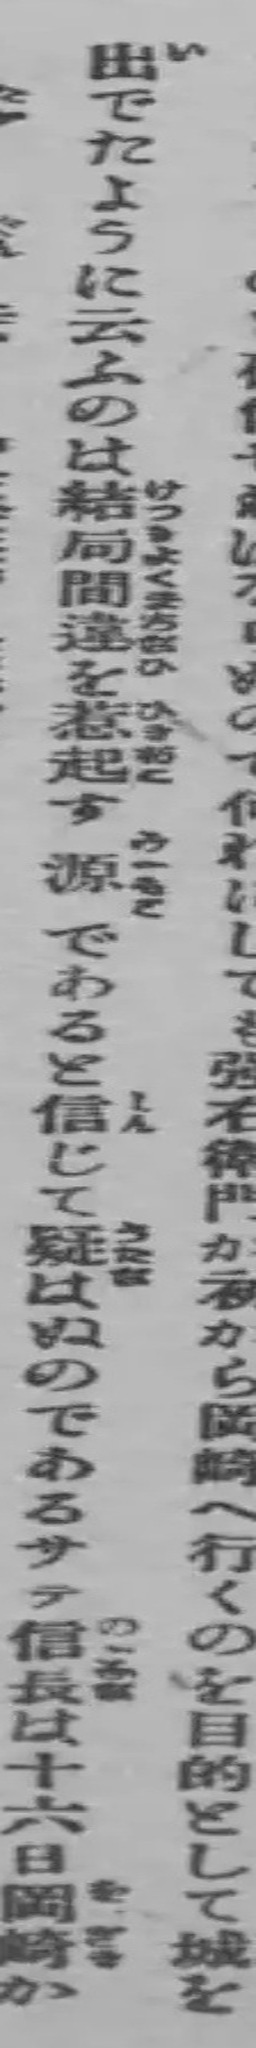出でたように云ふのは結局間違を惹起す源であると信じて疑はぬのであるサテ信長は十六日岡崎か
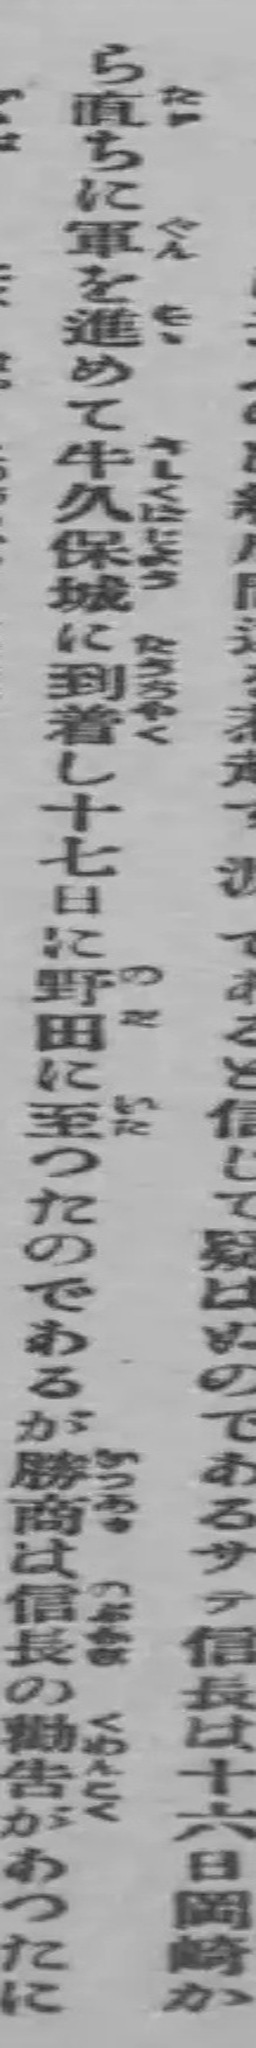ら直ちに軍を進めて牛久保城に到着し十七日に野田に至つたのであるが勝商は信長の勧告があつたに
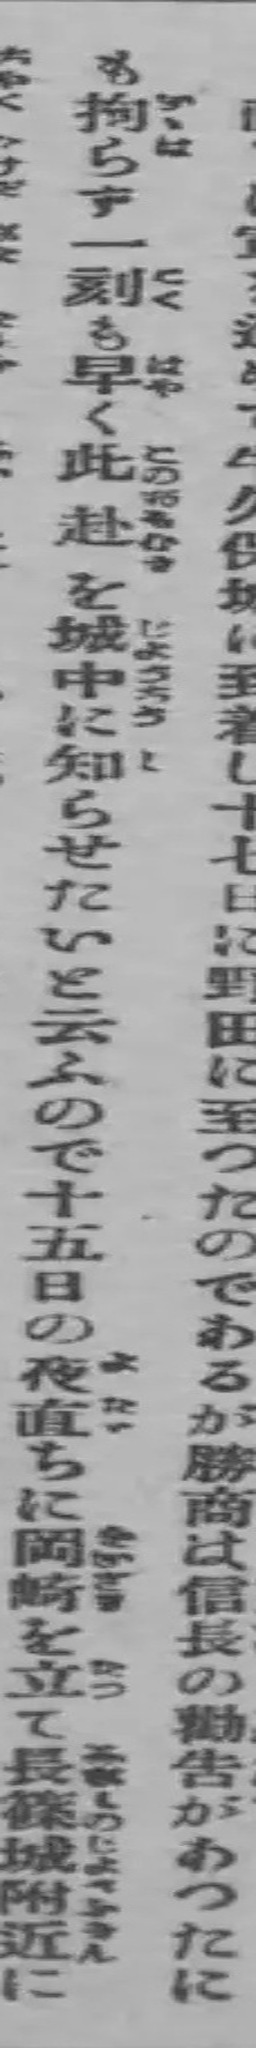も拘らず一刻も早く此赴を城中に知らせたいと云ふので十五日の夜直ちに岡崎を立て長篠城附近に
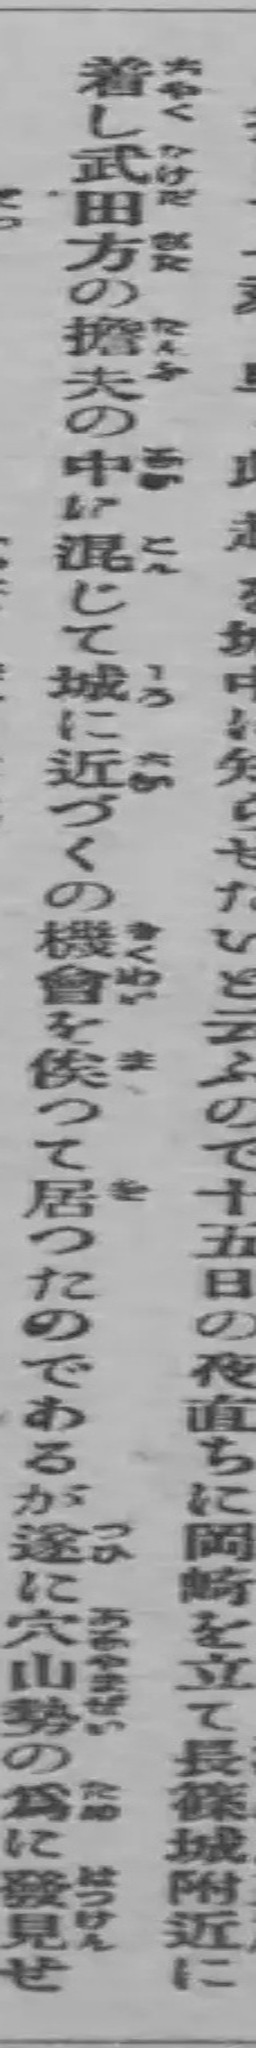着し武田方の担夫の中に混じて城に近づくの機会を俟つて居つたのであるが遂に穴山勢の為に発見せ
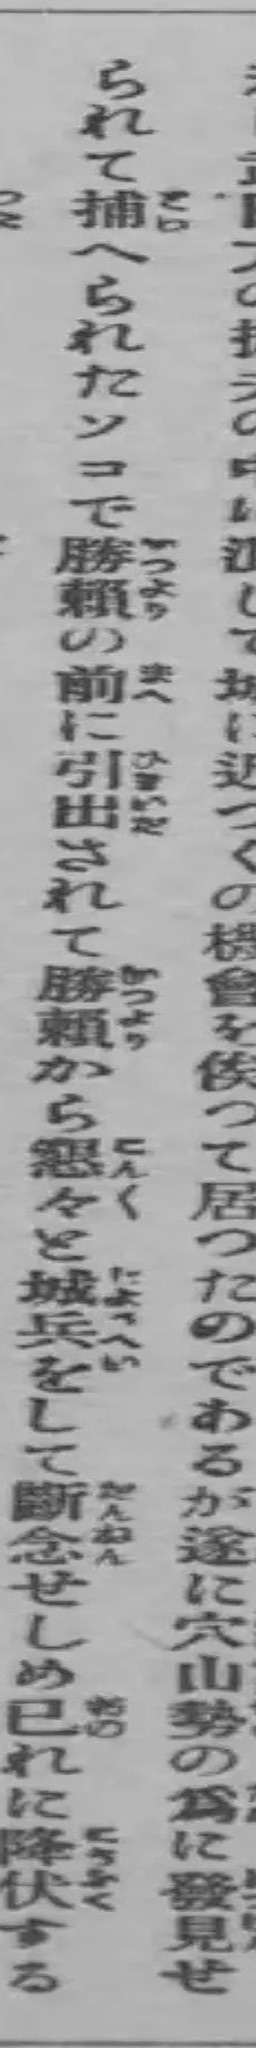られて捕へられたソコで勝頼の前に引出されて勝頼から懇々と城兵をして断念せしめ巳れに降伏する
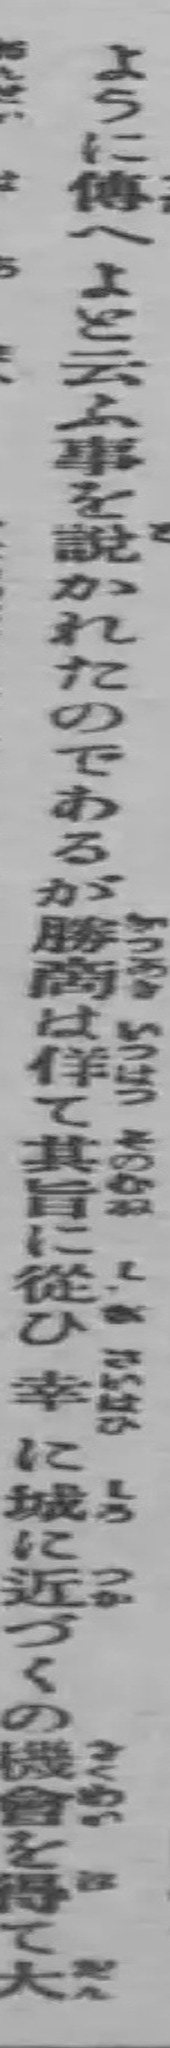ように伝へよと云ふ事を説かれたのであるが勝商は佯て其旨に従ひ幸に城に近づくの機会を得て大
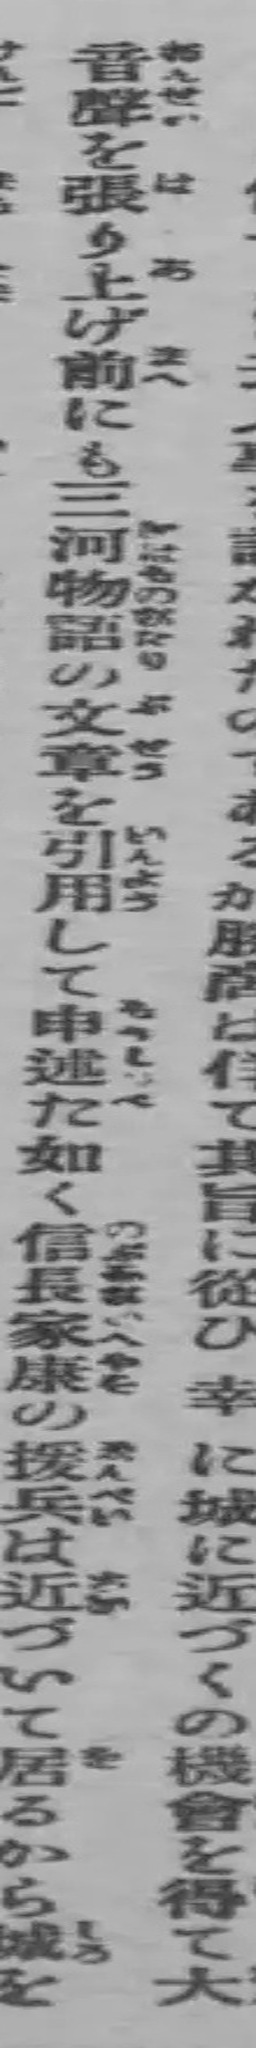音声を張り上げ前にも三河物語の文章を引用して申述た如く信長家康の援兵は近づいて居るから城を
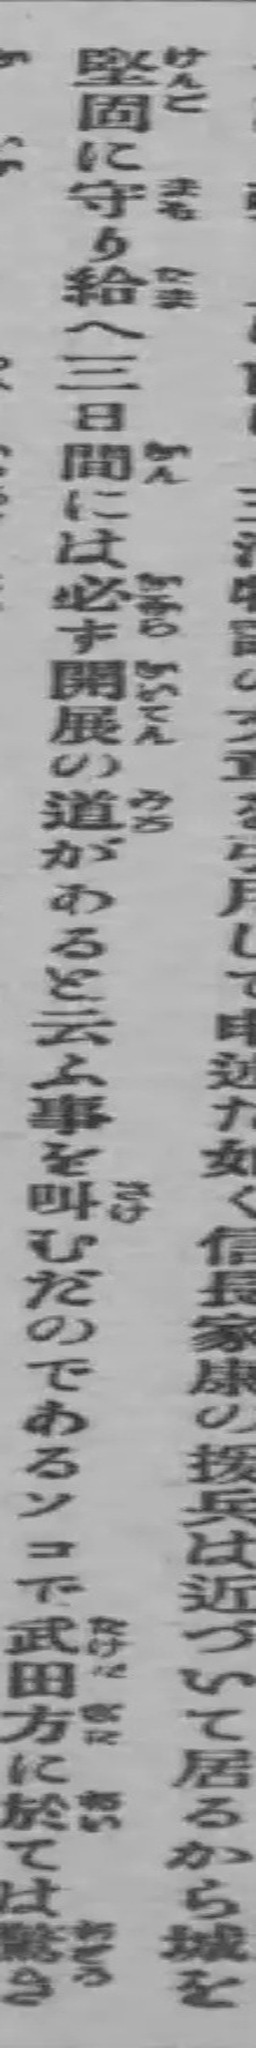堅固に守り給へ三日間には必ず開展の道があると云ふ事を叫むだのであるソコで武田方に於ては驚き
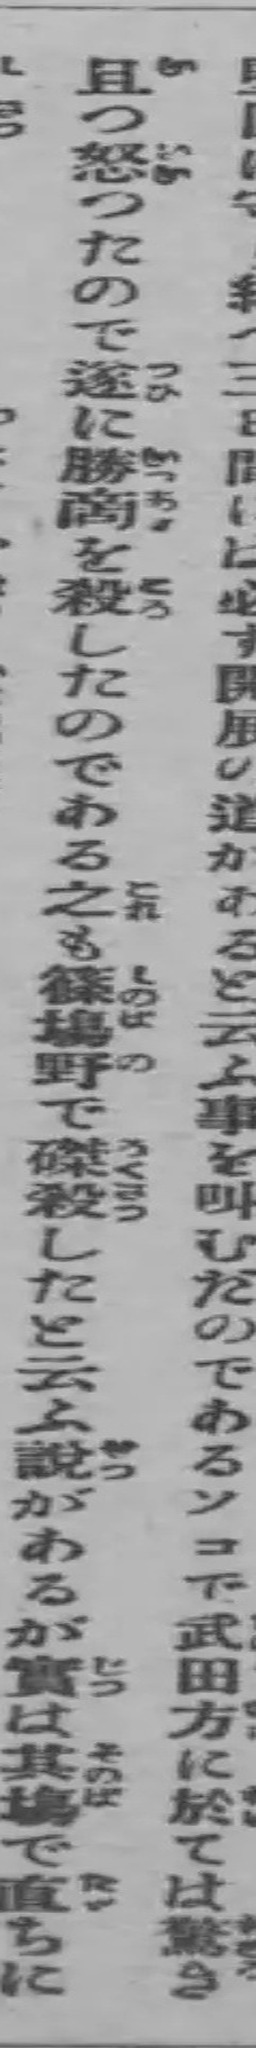且つ怒つたので遂に勝商を殺したのである之も篠場野で磔殺したと云ふ説があるが実は其場で直ちに
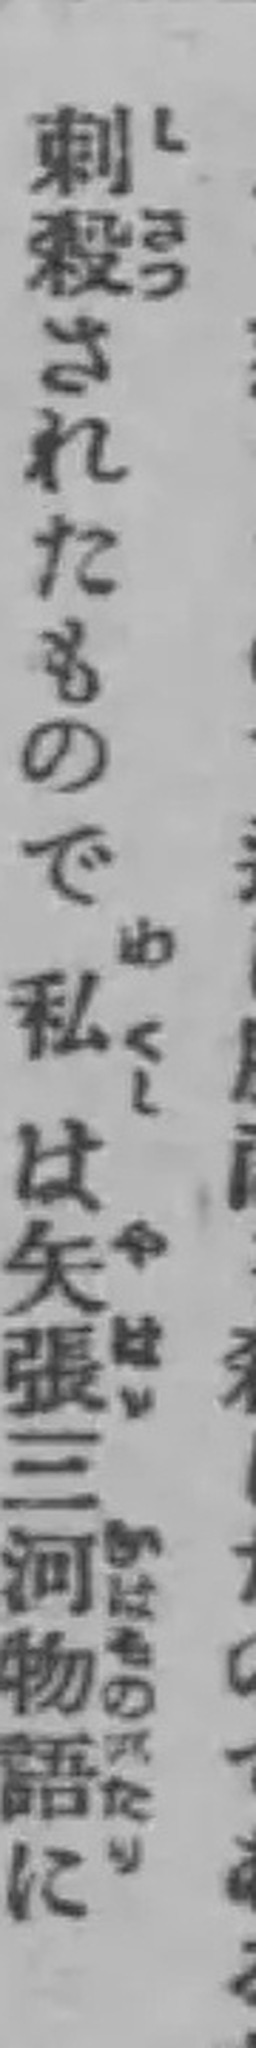刺殺されたもので私は矢張三河物語に
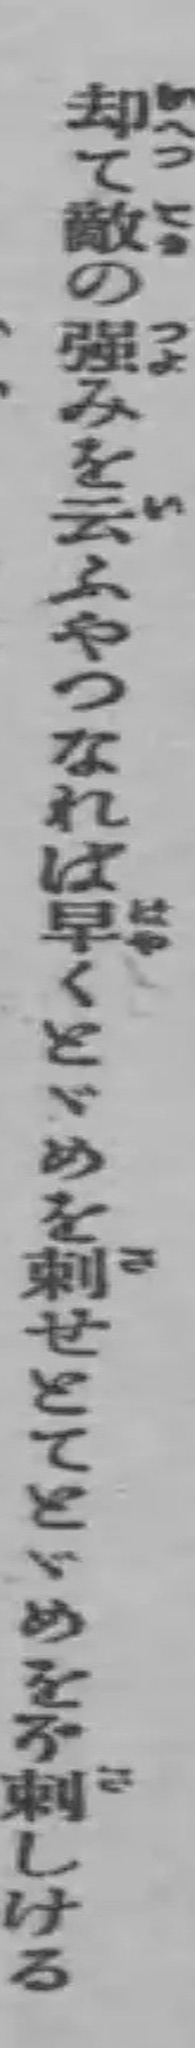却て敵の強みを云ふやつなれば早くとゞめを刺せとてとゞめをぞ刺しける
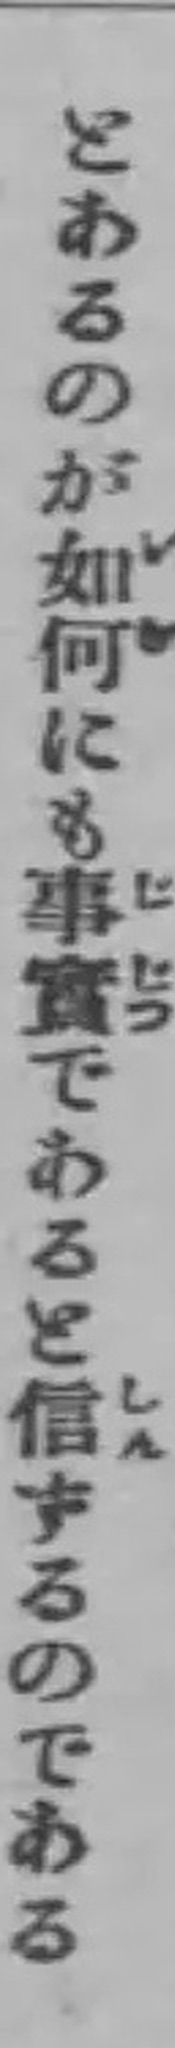とあるのが如何にも事実であると信ずるのである
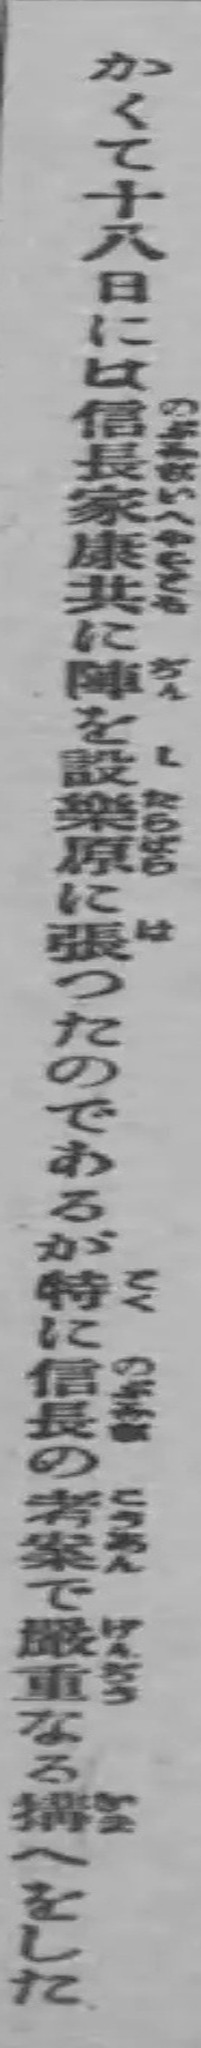長篠合戦かくて十八日には信長家康共に陣を設楽原に張つたのであるが特に信長の考案で厳重なる搆へをした
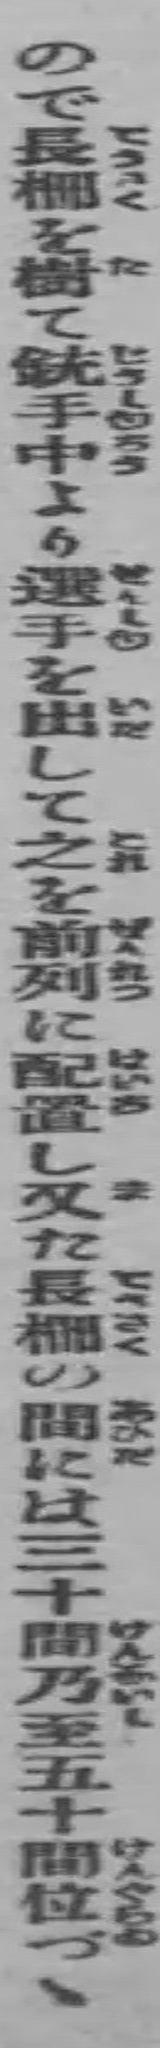ので長柵を樹て銃手中より選手を出して之を前列に配置し又た長柵の間には三十間乃至五十間位づゝ
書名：豊橋市史談
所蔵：国立国会図書館 National Diet Library, JAPAN
